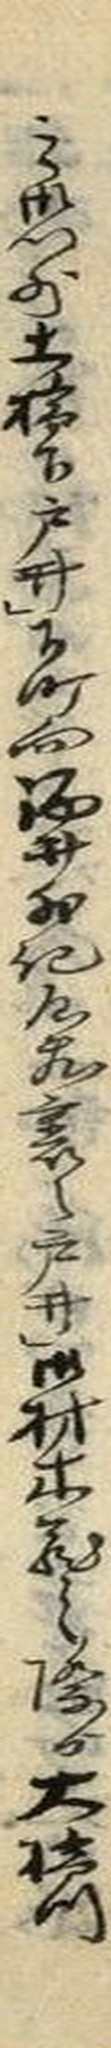之御門外土橋下戸井」下町向酒井外記屋敷裏之戸井」御材木蔵之際ゟ大橋川
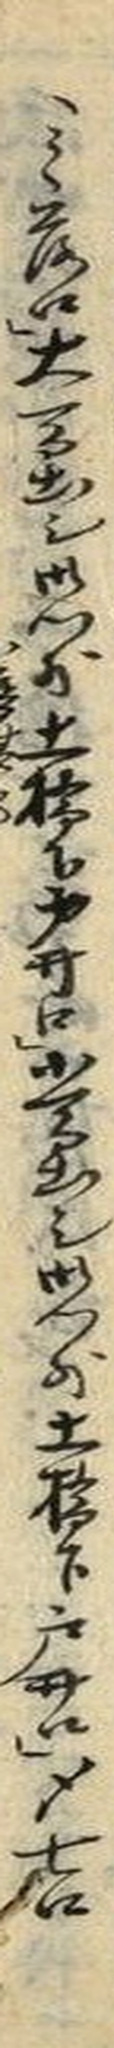へ之落口」大馬出シ御門外土橋下戸井口」小馬出シ御門外土橋下戸井口」〆七口
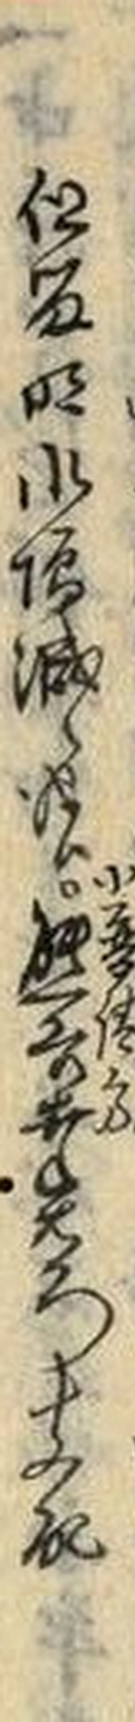但留明水増減之儀ハ◦熊谷幸右衛門支配

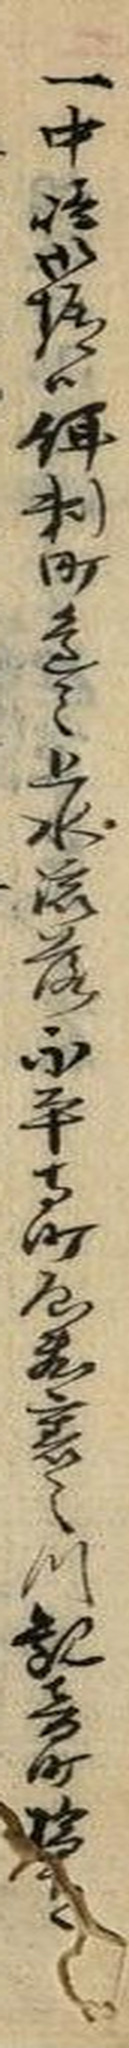一中島御堀へは餌刺町辺之上水流落永平寺町屋敷裏之川観音寺橋下へ
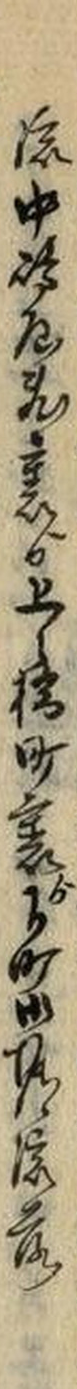流中島屋敷裏ゟ上之橋町裏ゟ下町御堀へ流落
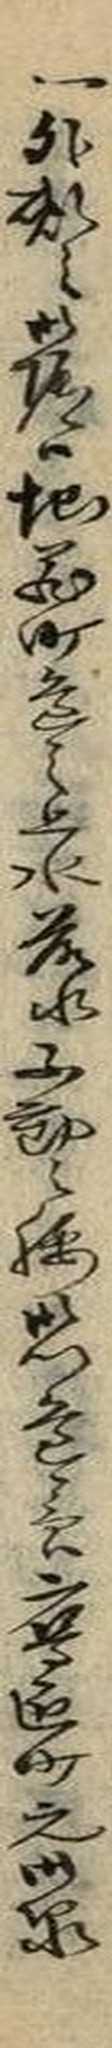一外頬之御堀へは地蔵町辺之上水落水不動之腰御門辺にては鷹匠町元御泉
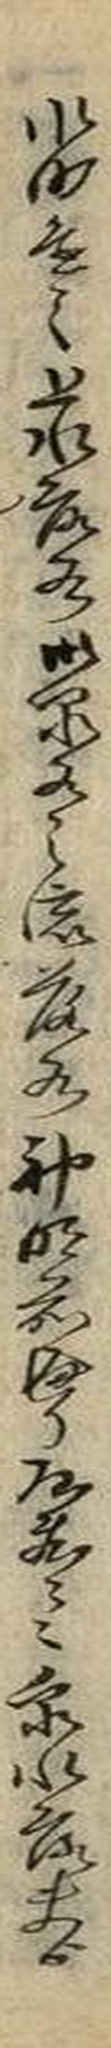水町辺之上水落水御泉水之流落水神明前通り屋敷々々泉水落夫ゟ
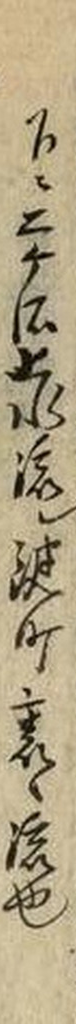下に二ケ所上水流レ鍵町裏へ流也
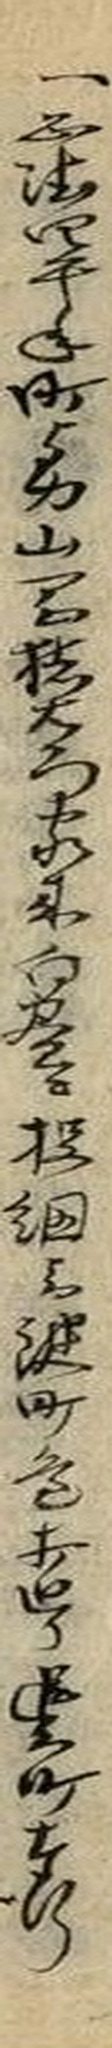一正徳四午年町与力山岡猪右衛門家来白昼に投網にて鍵町辺打廻り追て町奉行
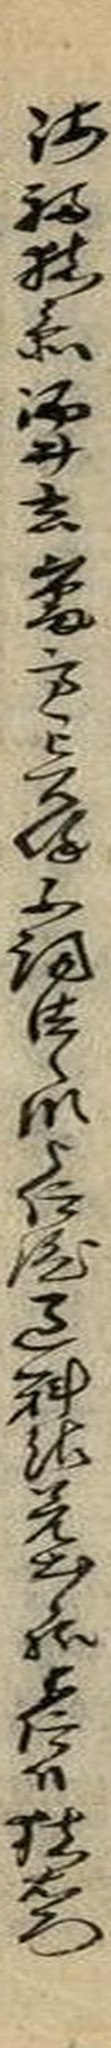海福猪兵衛酒井玄蕃方へ被召呼不調法之段被仰渡過料銀差出候様被仰付猪右衛門
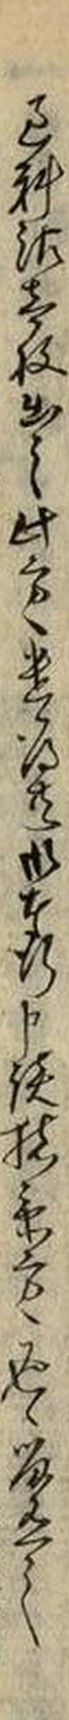過料銀壱枚出之此方へ遣候得共御奉行申談猪兵衛方へ返候留有之
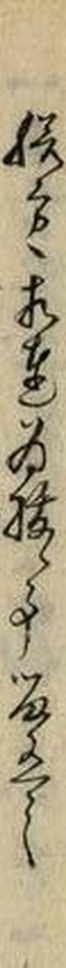膳方へ相達為抜候事留有之
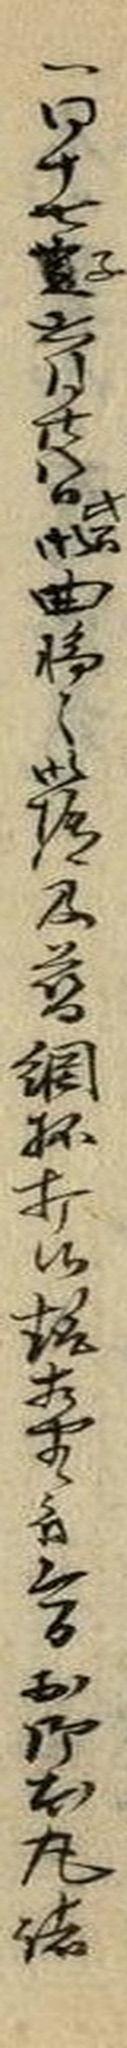一同十七子六月廿八日此間御曲輪之御堀へ及暮網抔打候趣相聞候に付今日於御本丸諸
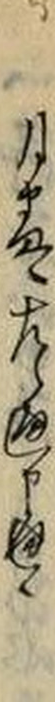月番へ左之通申通候
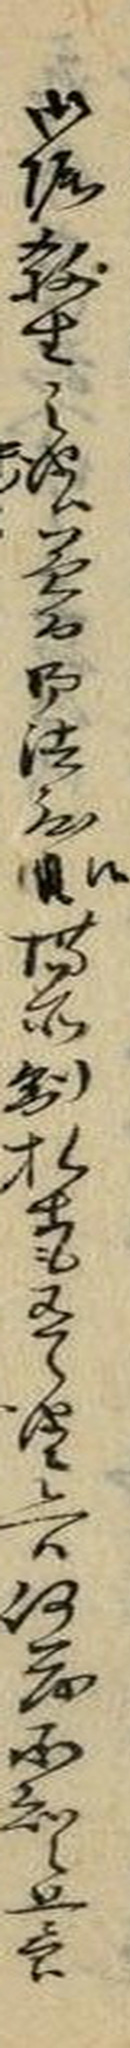御堀殺生之儀は兼て御法度候場所制札等も有之儀に候へは何も承知之上にては
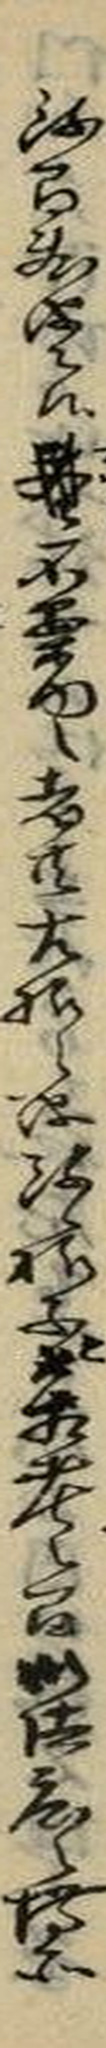致間敷儀に候末々不案内之者共左様之儀致候様子と相考候間御法度之場所
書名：御城下諸事之部
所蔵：福井県文書館 Fukui Prefectural Archives
